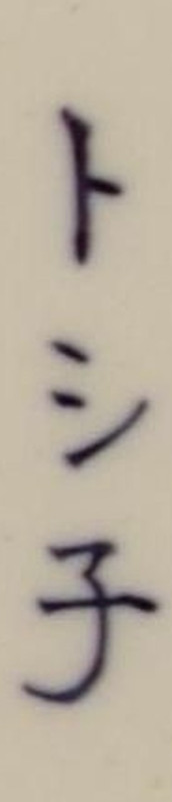トシ子
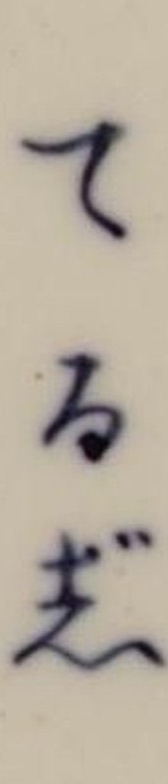てるじ
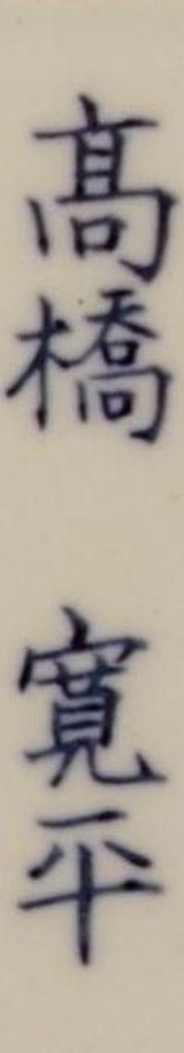高橋寛平
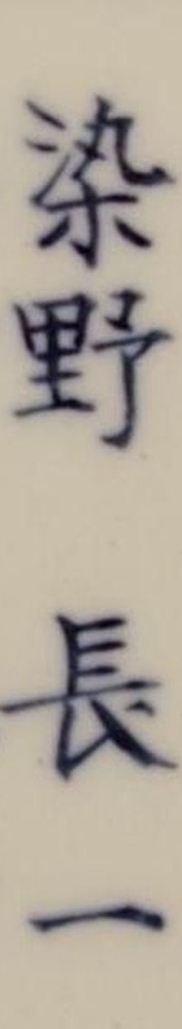染野長一
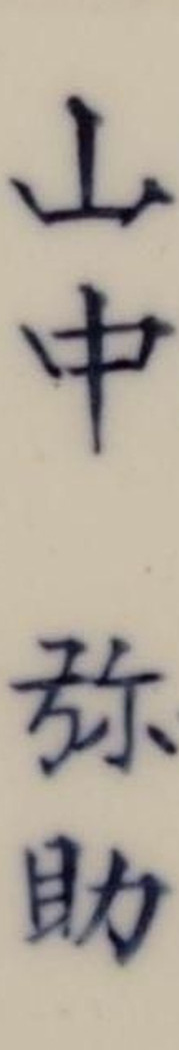山中弥助
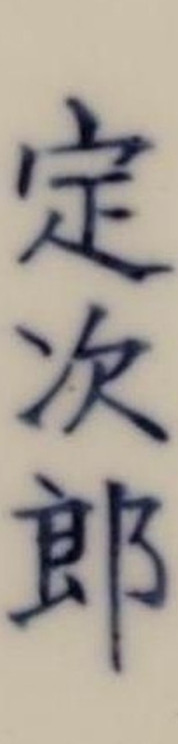定次郎
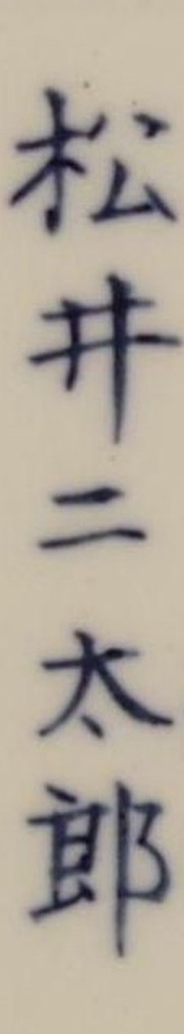松井二太郎
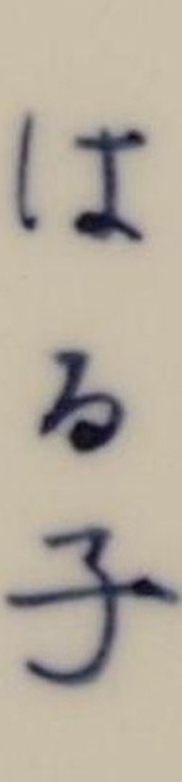はる子
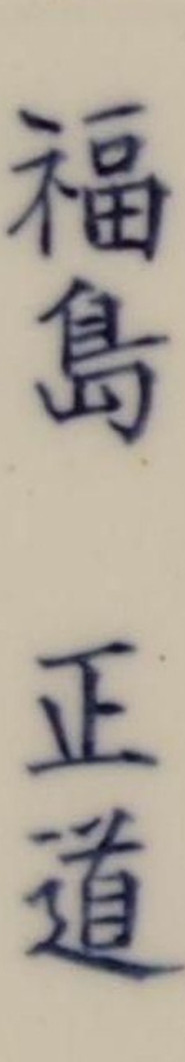福島正道
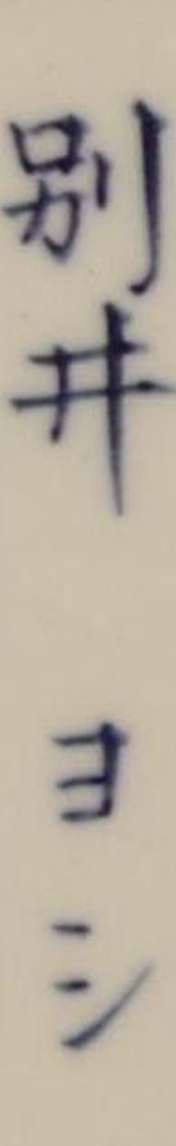別井ヨシ
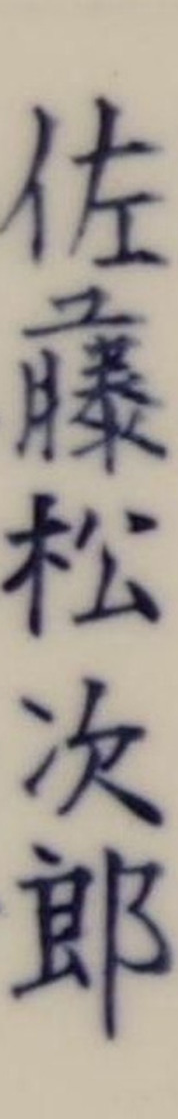佐藤松次郎
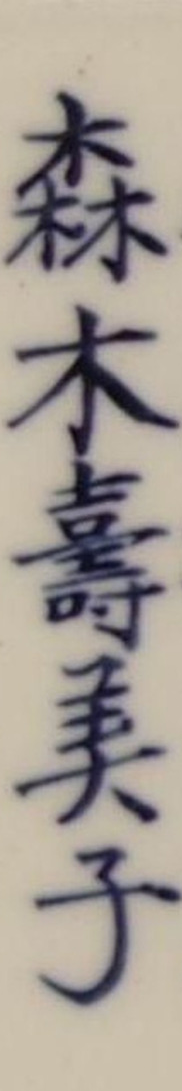森木壽美子
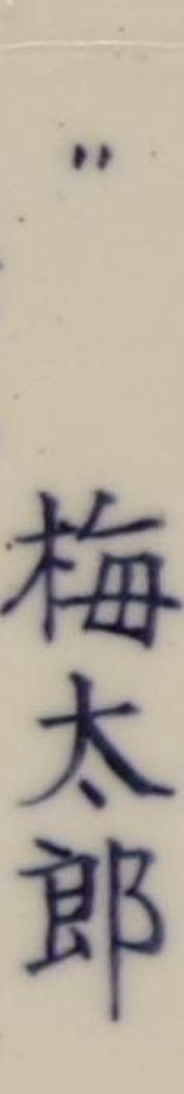梅太郎
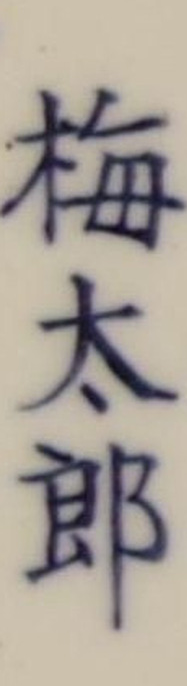梅太郎
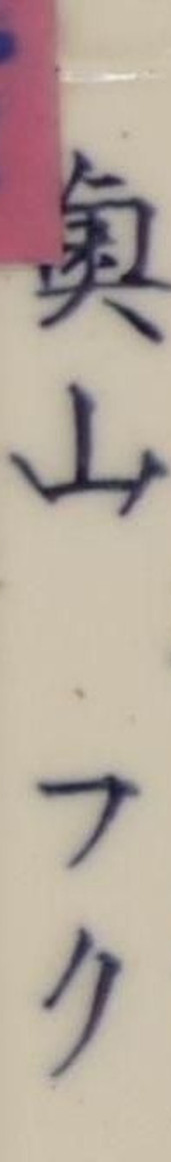奥山フク

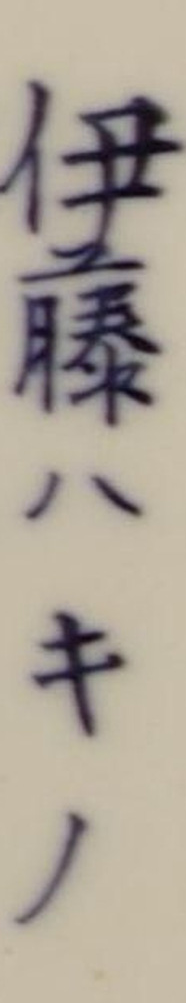伊藤ハキノ
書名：E~L
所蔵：高野山金剛峯寺
